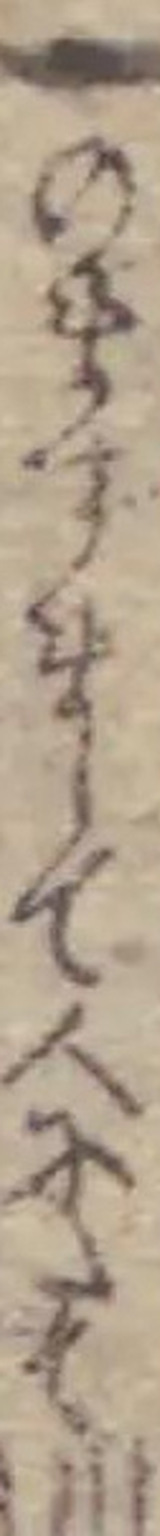のまずまして人にたて
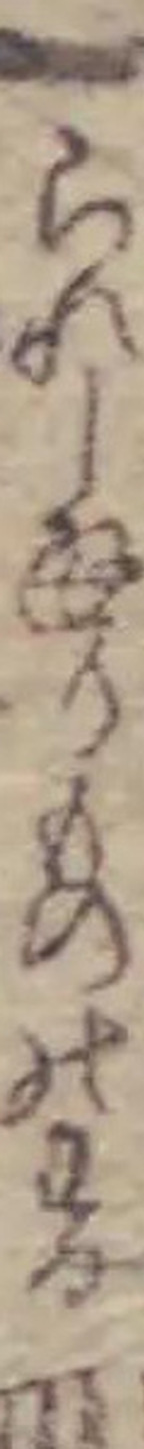られし通りもののわる
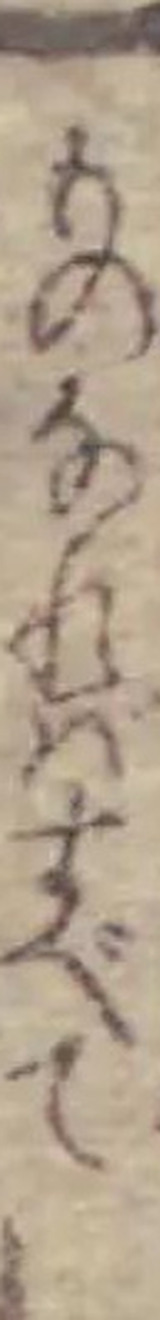ものなればすべて
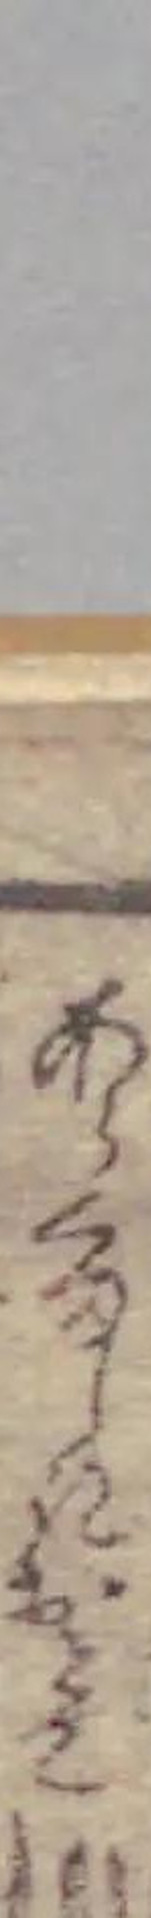あらくましきおとこ
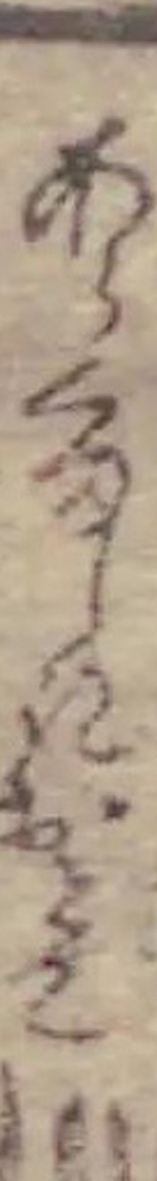あらくましきおとこ
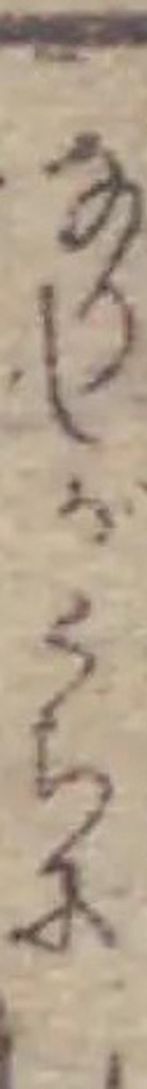なりしがうちに
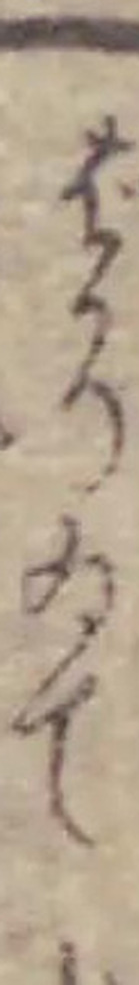ばかりゐて
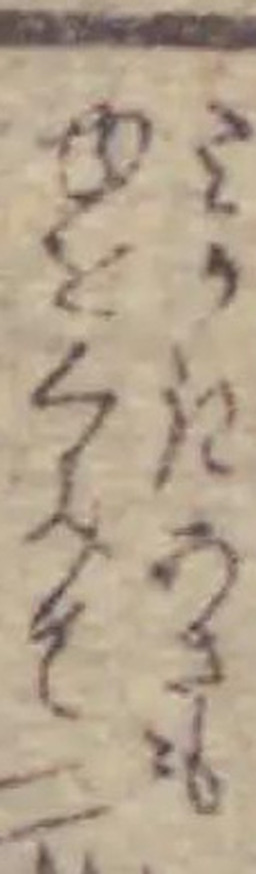ゆをくみて
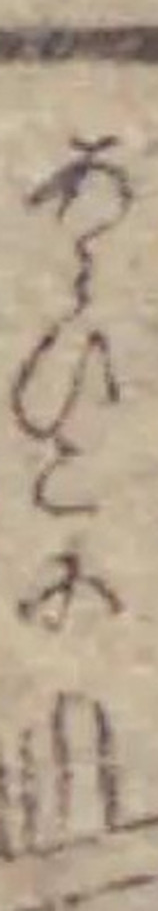あらひこに
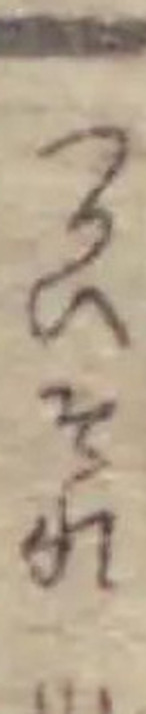つかひそれ
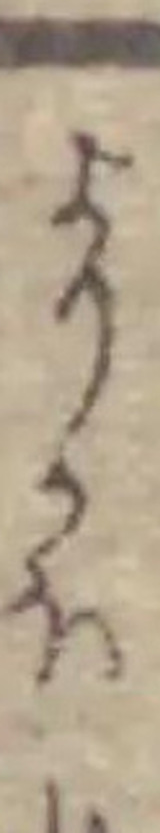よりかほ
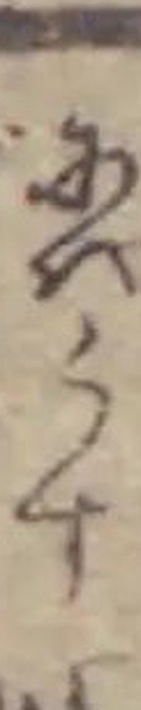にはうす
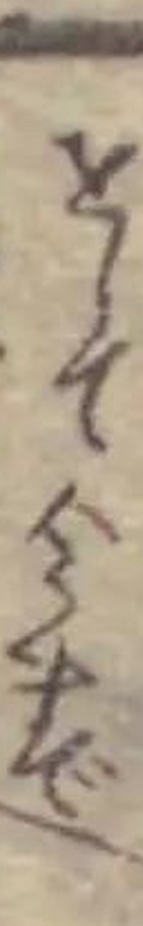をして今まで
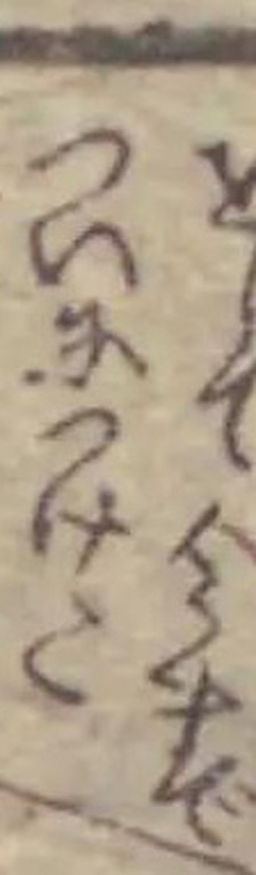ついにつけた
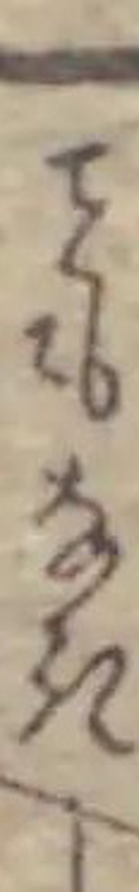こともなき
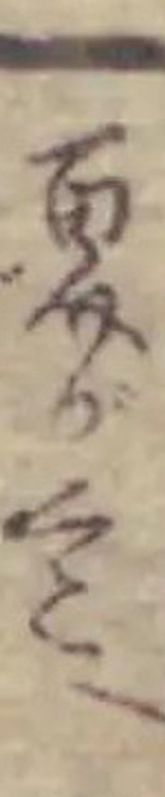百介がくこ
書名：飛た間違矢口噂 2巻
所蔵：国立国会図書館 National Diet Library, JAPAN
